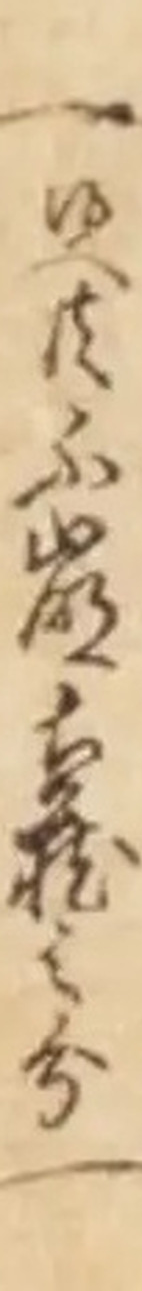候へ共不崩古蔵之分
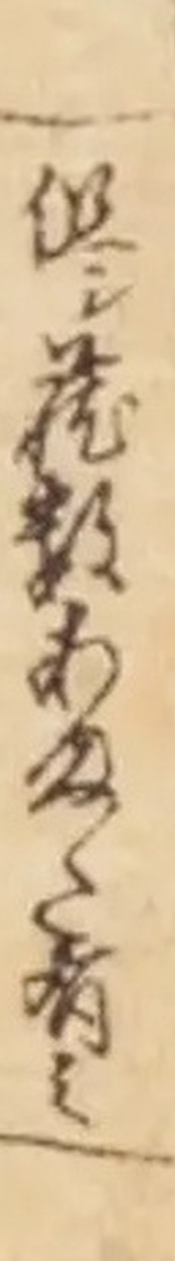但し蔵数あまた有之
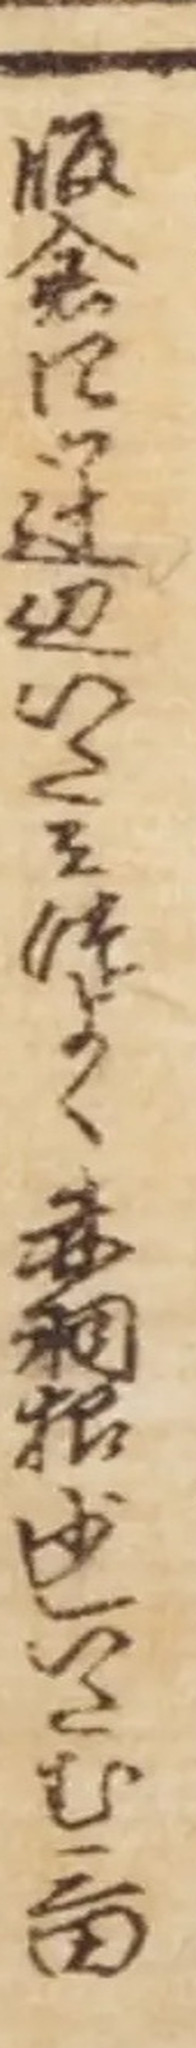飯倉四ツ辻辺いたみつよく赤初根すこしいたむ三田
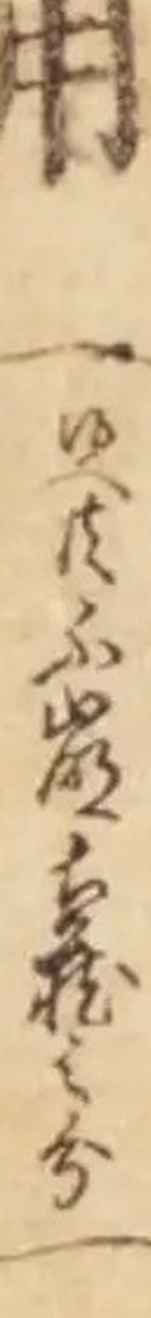候へ共不崩古蔵之分
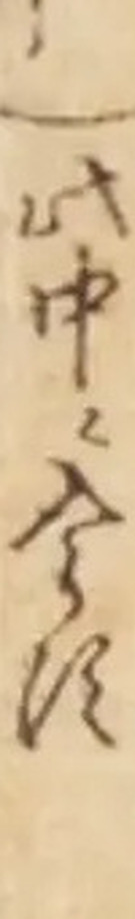此中に入らず
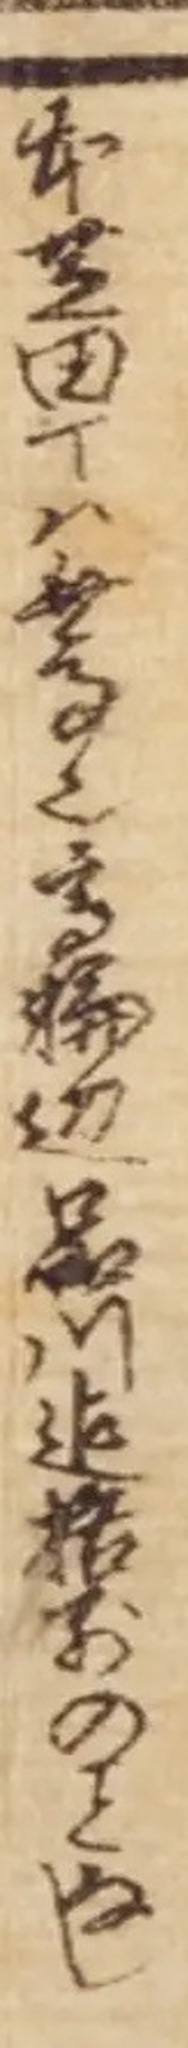本芝田丁は無事也高輪辺品川迄格別のことなし
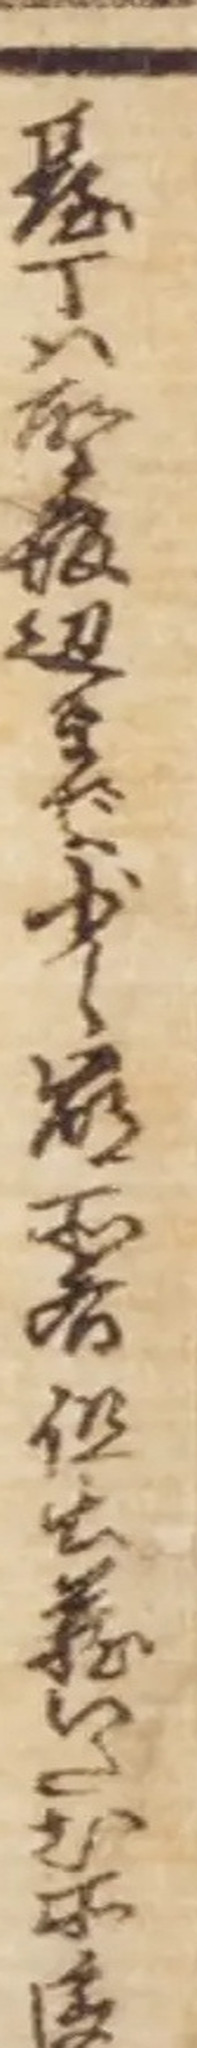臺丁は聖坂辺まで少し崩所有但土蔵いたむ所多し

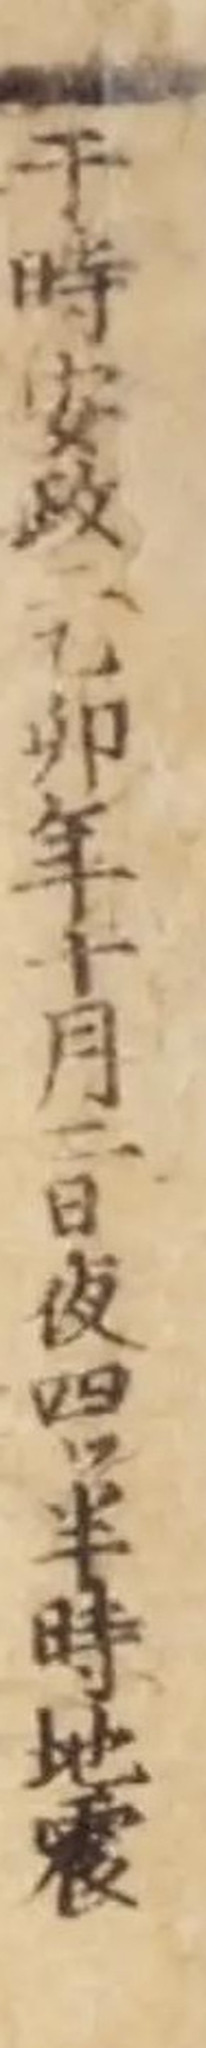于時安政二乙卯年十月二日夜四ツ半時地震
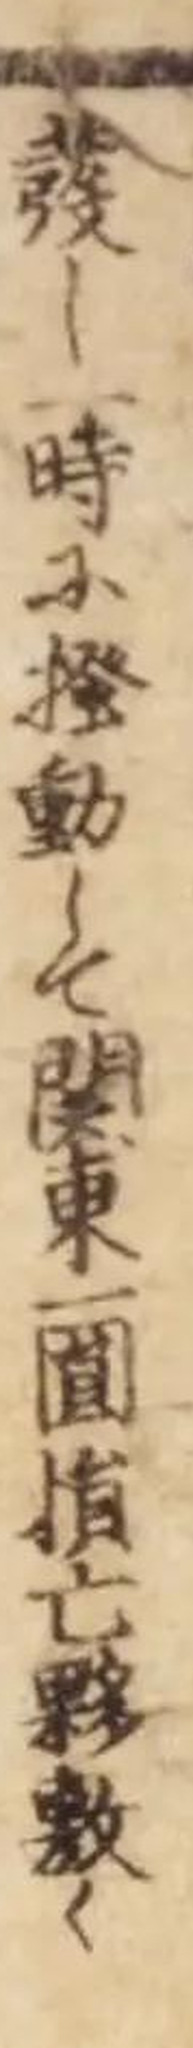発し一時に発動して関東一円損亡夥敷く
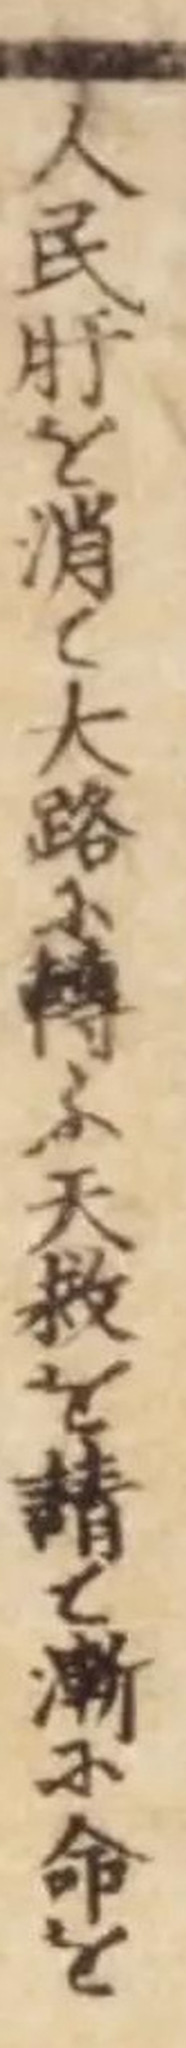人民肝を消て大路に轉ふ天救を請て漸に命を
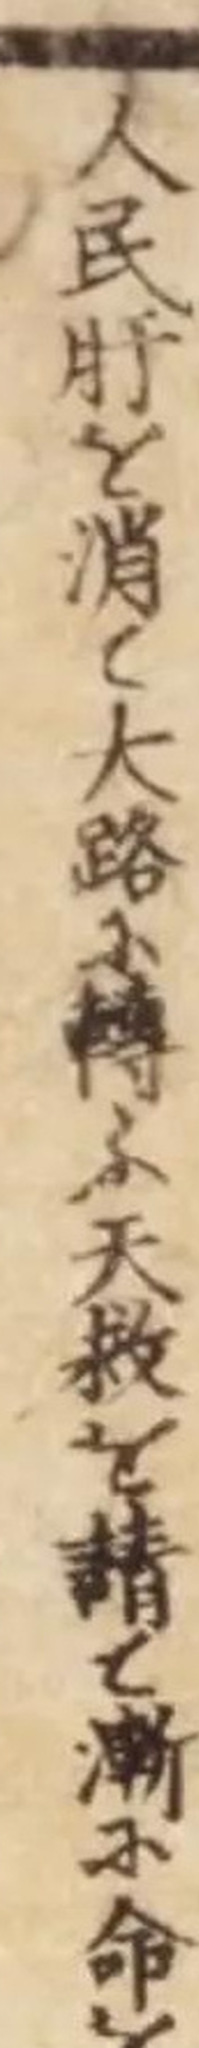人民肝を消て大路に轉ふ天救を請て漸に命を
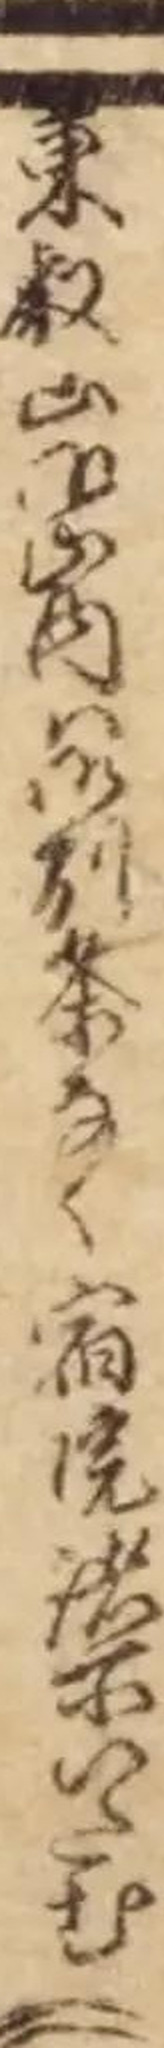東叡山御山内は御別条なく宿院諸所いたむ
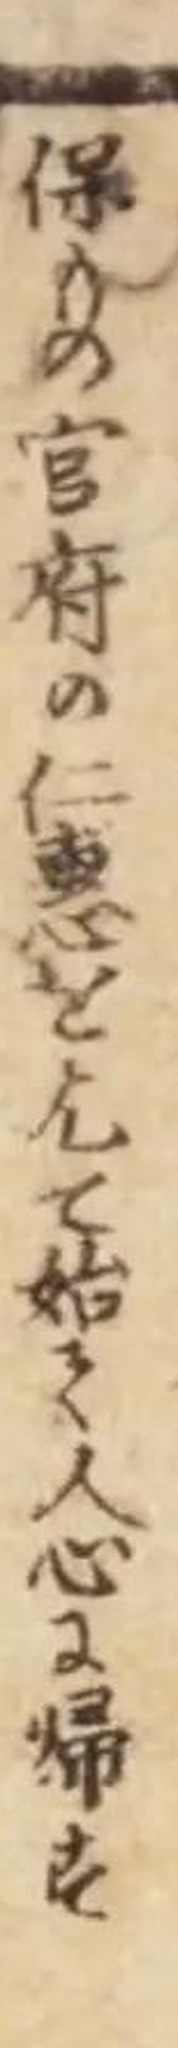保もの官府の仁恵を乞て始て人心に帰す
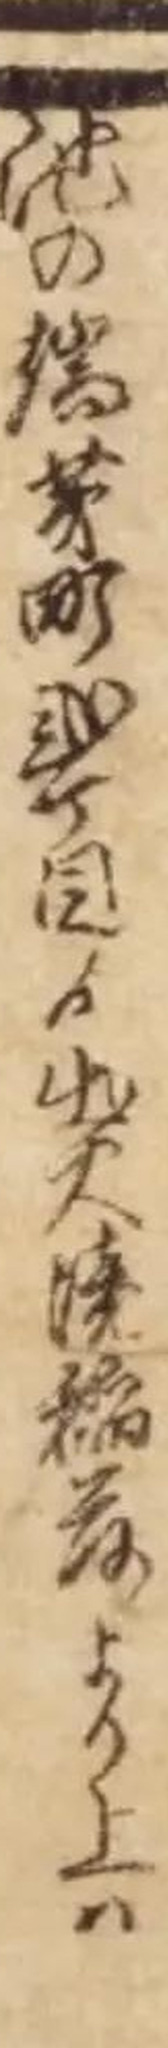池の端茅町弐丁目より出火境稲荷より上は
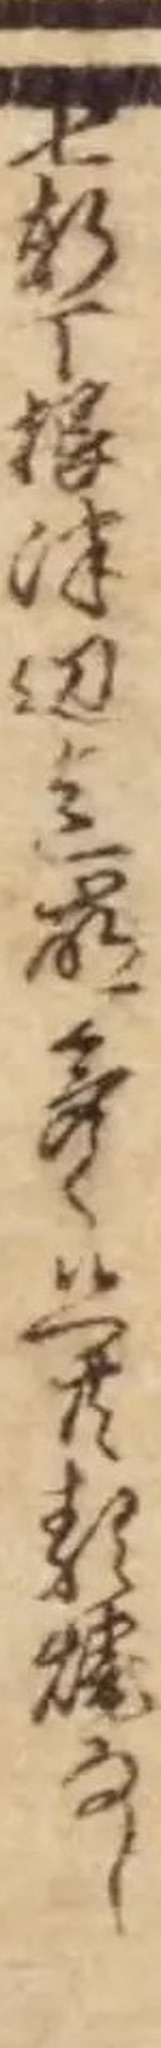七軒丁根津辺迄崩多く候へ共類焼なし
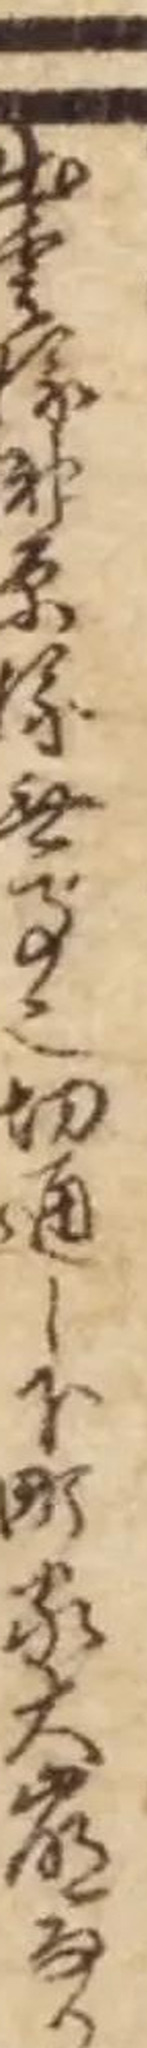出雲様榊原様無事也切通し下町家大崩なり
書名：御江戸関八州大地震出火巨細記
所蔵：国立国会図書館 National Diet Library, JAPAN
